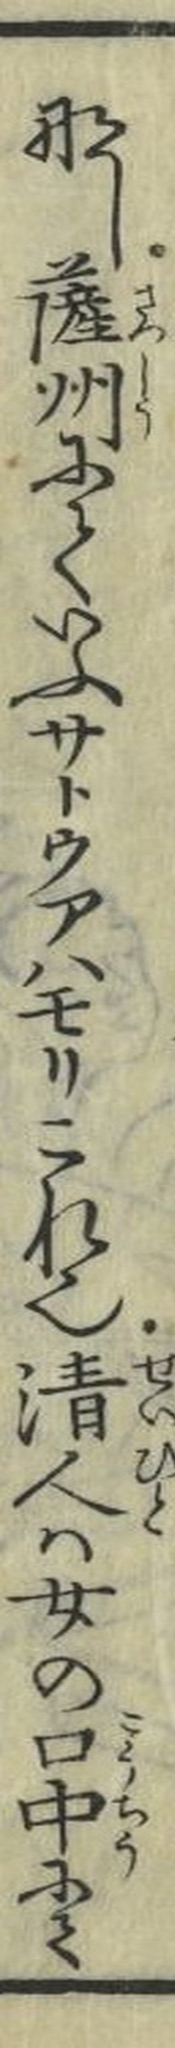なし・薩州にていふサトウアハモリこれ也・清人は女の口中にて
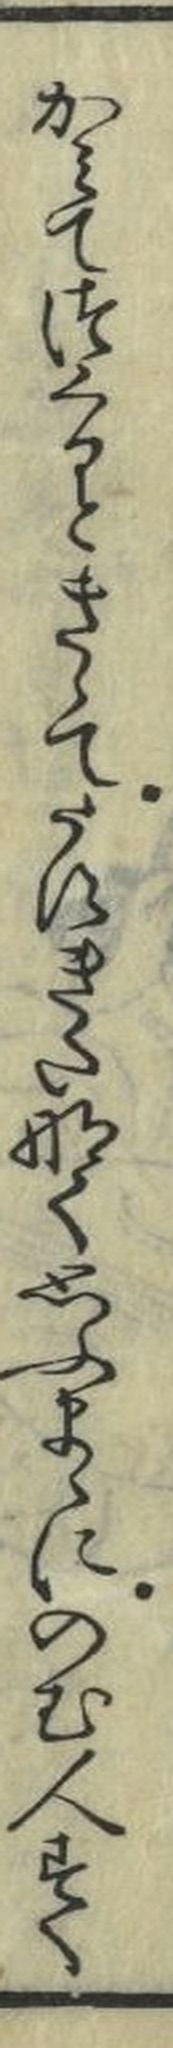かみてつくるときゝて・うすきたなく思ふまゝに・のむ人すく
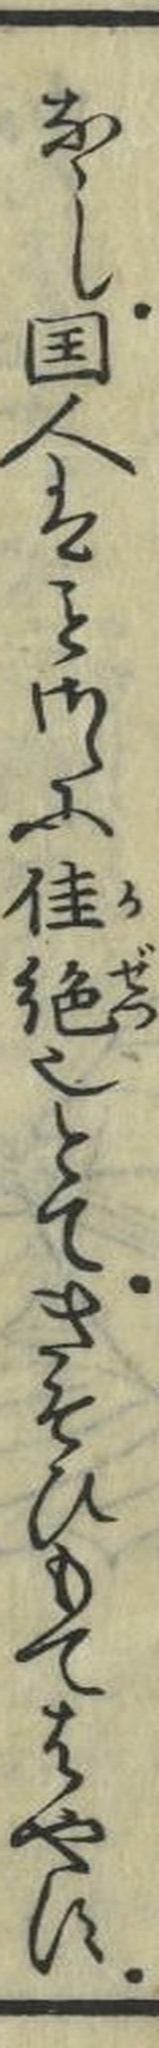なし・国人はことさらに佳絶也とて・きそひもてはやす・
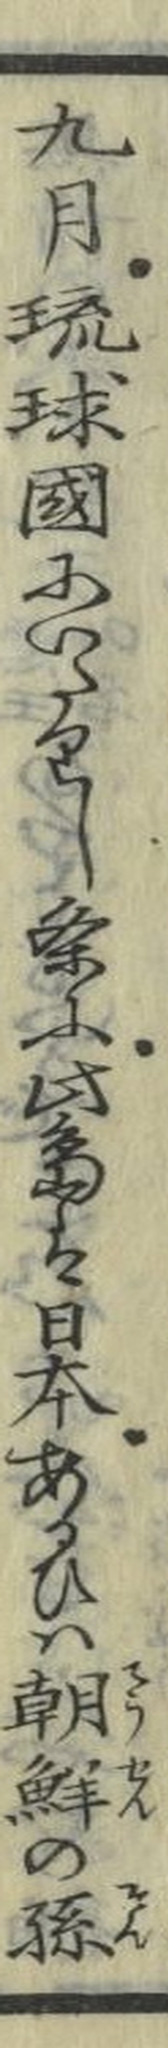九月・琉球國にいたりし条に・此島は日本・あるひは朝鮮の孫
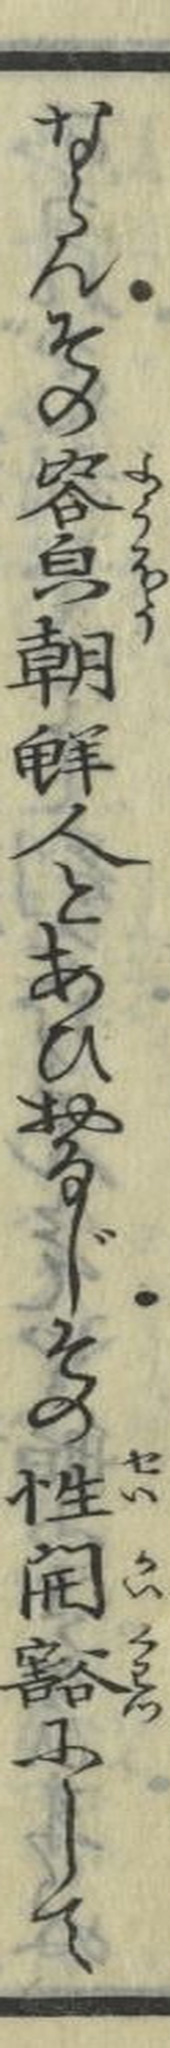ならん・その容皃朝鮮人とあひおなじ・その性開豁にして
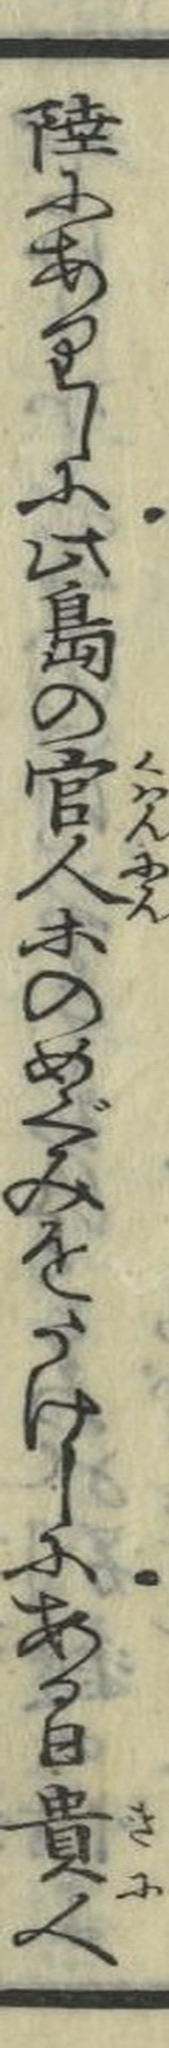陸にありしに・此島の官人等のめぐみをうけしに・ある日貴人
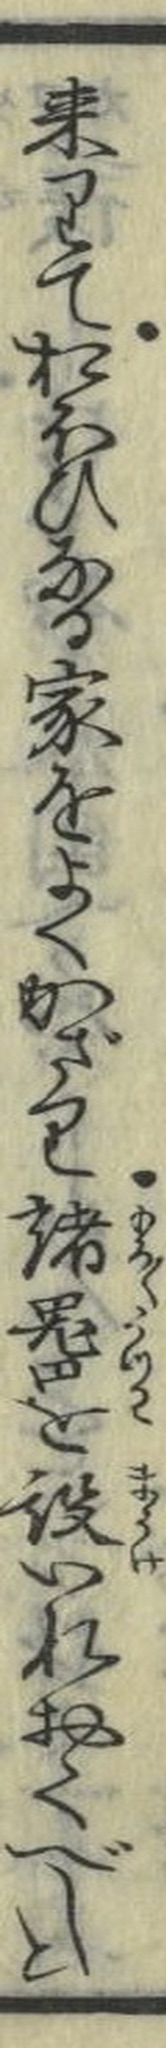来りて・おほひなる家をよくかざり・諸器を設いれおくべしと
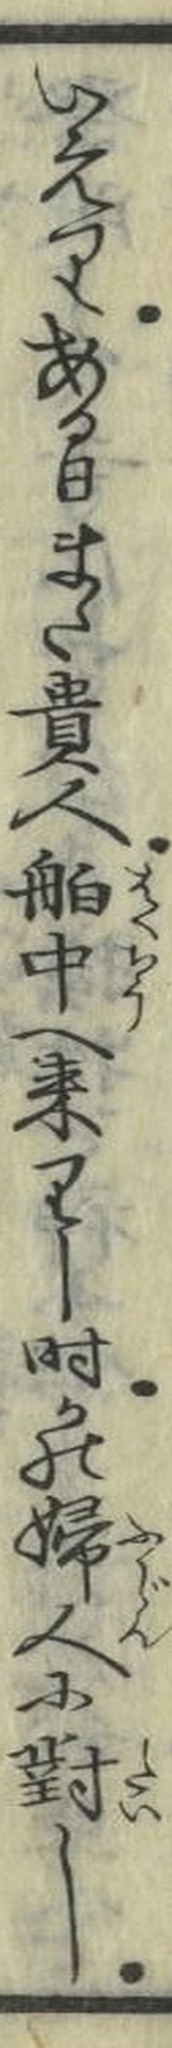いえり・ある日また貴人・舶中(はくちう)へ来りし時・かの婦人に對し・
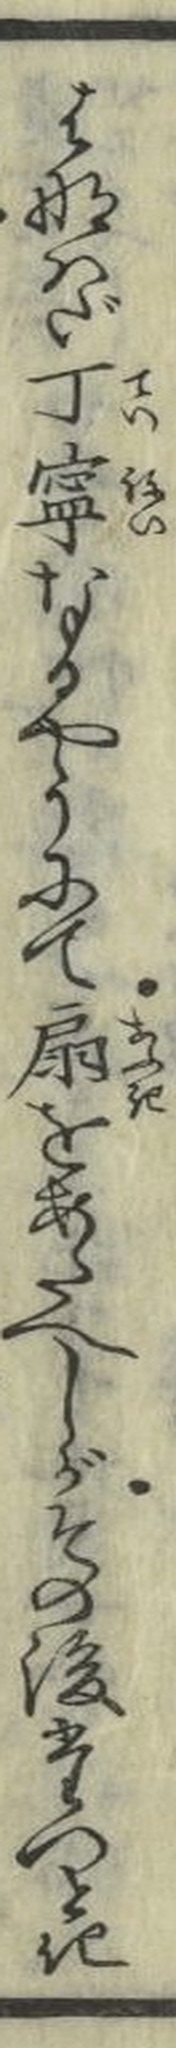はなはだ丁寧なるやうにて・扇をあたへしが・その後たつとき
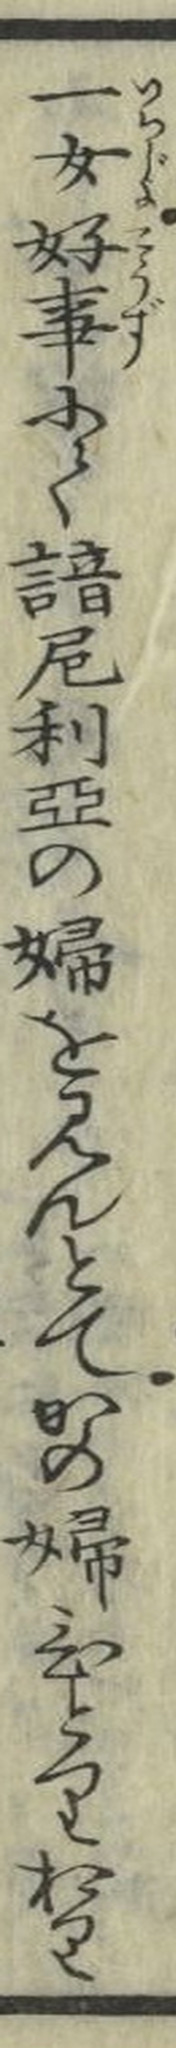一女・好事にて諳利亞の婦を見んとて・かの婦ひとりおり
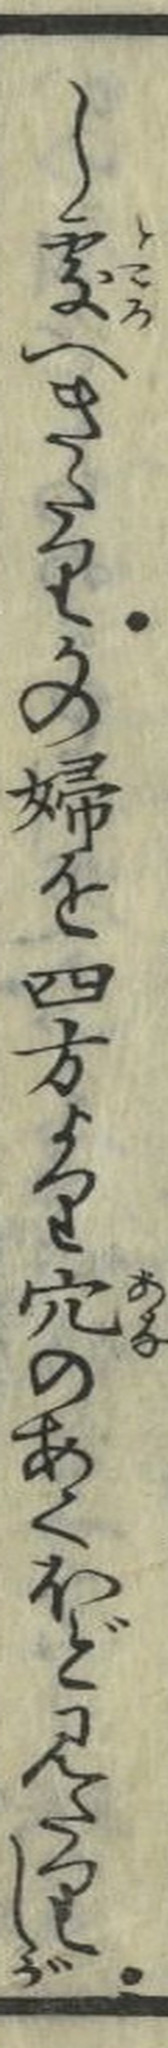し處へきたり・かの婦を四方より穴のあくほど見たりしが・

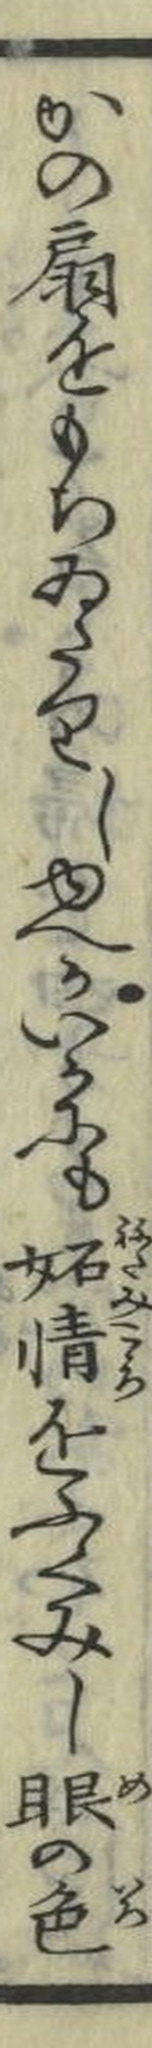かの扇をもちゐたりしゆへか・いかにも妬情をふくみし眼の色
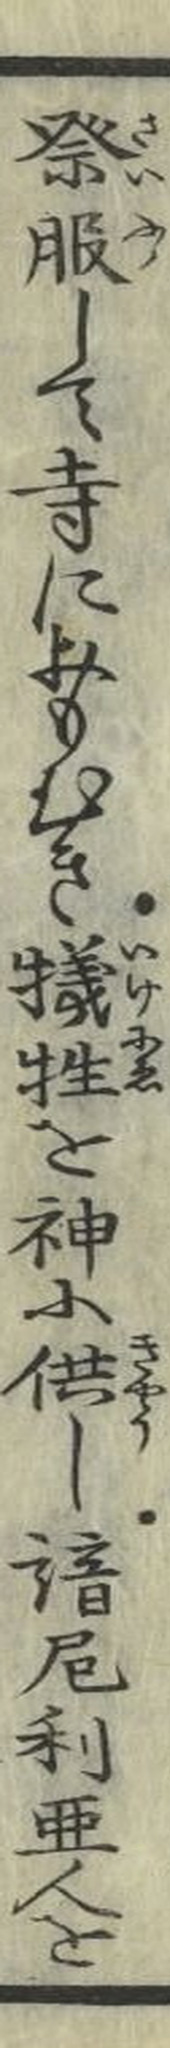祭服して寺におもむき・犠牲を神に供し・諳利亜人を
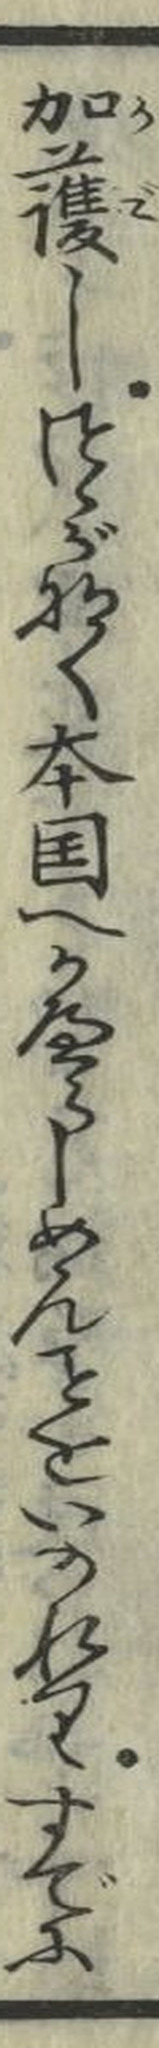加護し・つゝがなく本国へかへらしめんことをいのれり・すでに
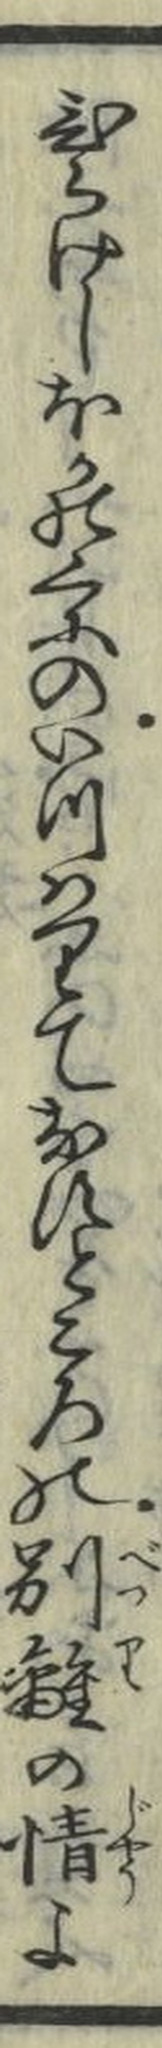ひらけしほかのくにの・いつはりてなすところの・別離の情よ
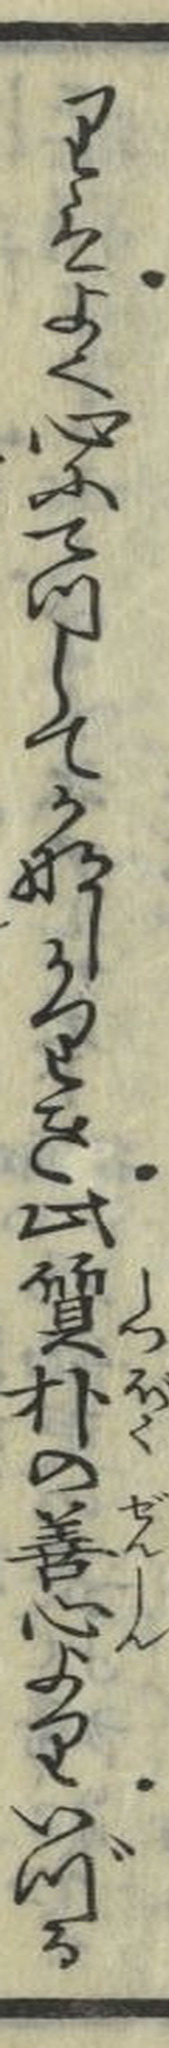りは・よく心にてつしてかなしかりを・此質朴の善心より・いづる
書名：琉球秊代記 附雑話 全
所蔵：University of the Ryukyus Library
